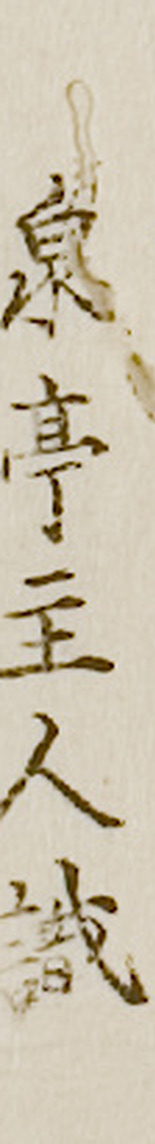泉亭主人識
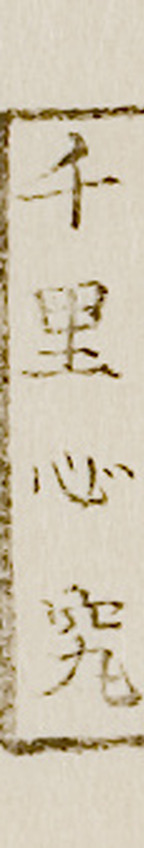千里必究
